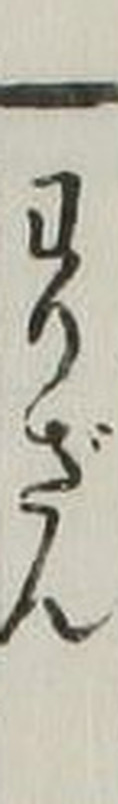わりざん
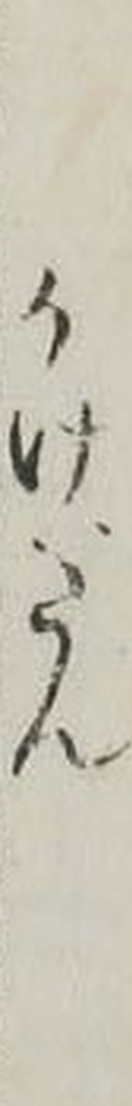かけざん
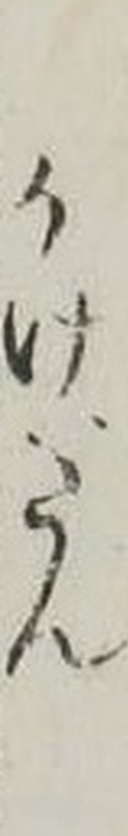かけざん
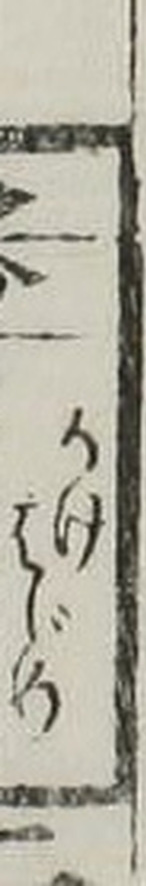はじめ
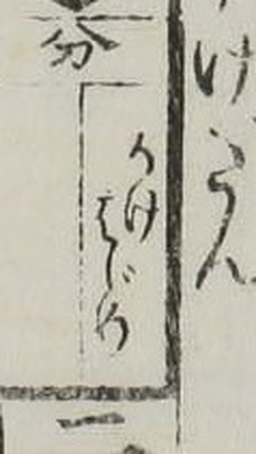はじめ
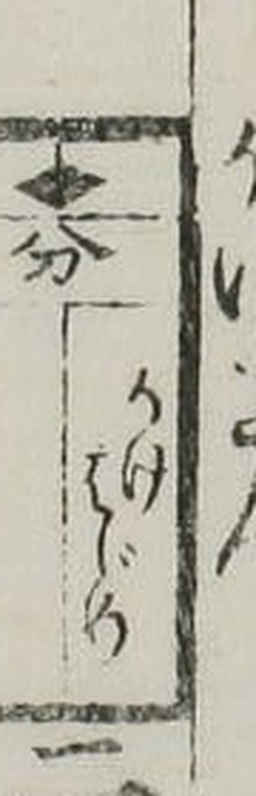はじめ
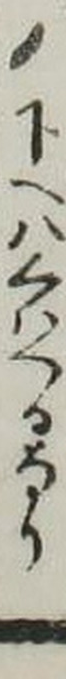下へ一をくわへるなり

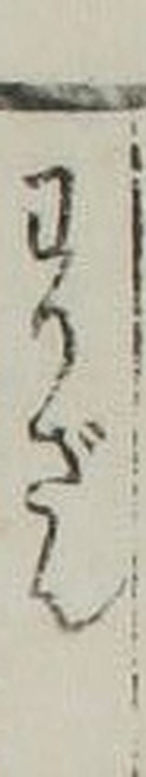わりざん
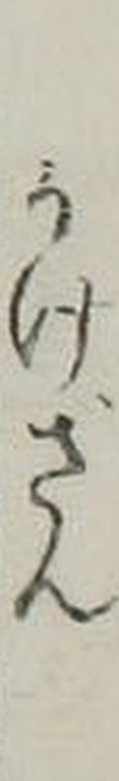かけざん
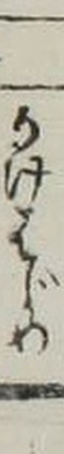かけはじめ
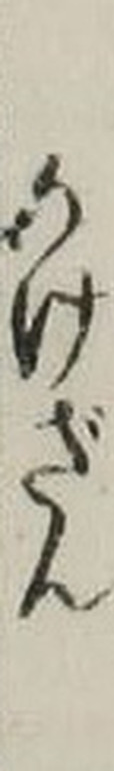かけざん
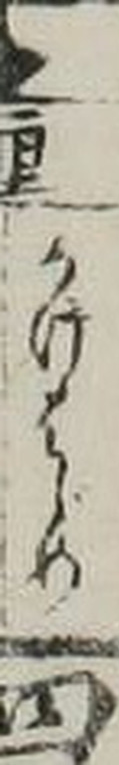かけはじめ
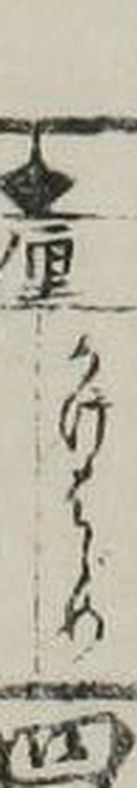かけはじめ

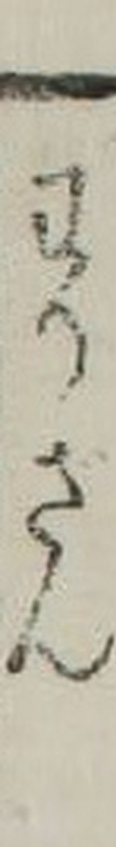わりざん
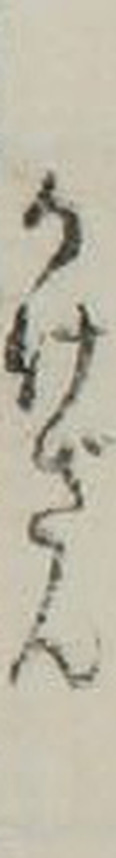かけざん
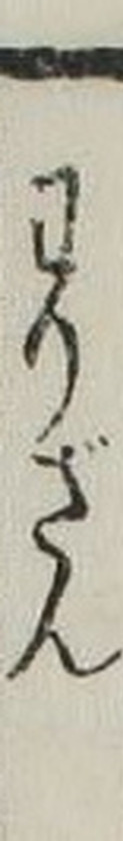わりざん
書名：宝玉塵劫記
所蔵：東京学芸大学教育コンテンツアーカイブ
